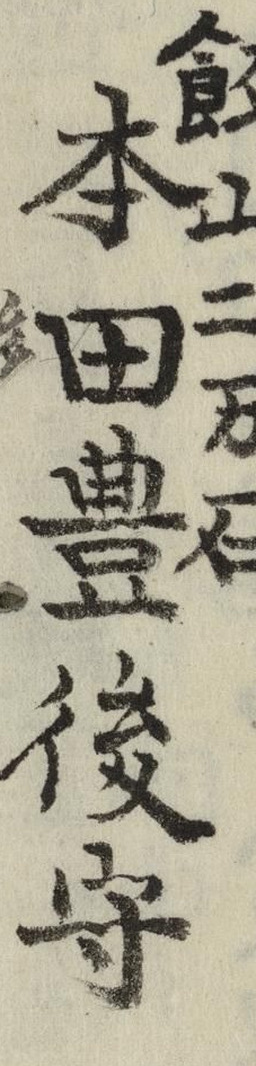本多豊後守
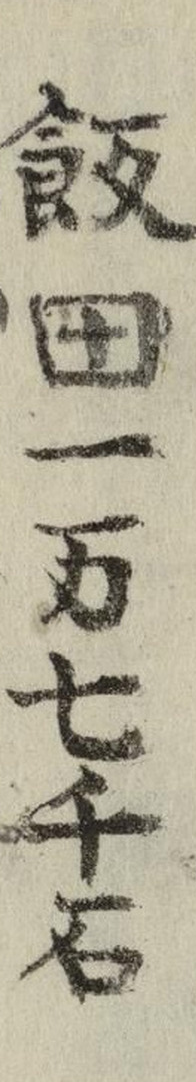飯田一万七千石
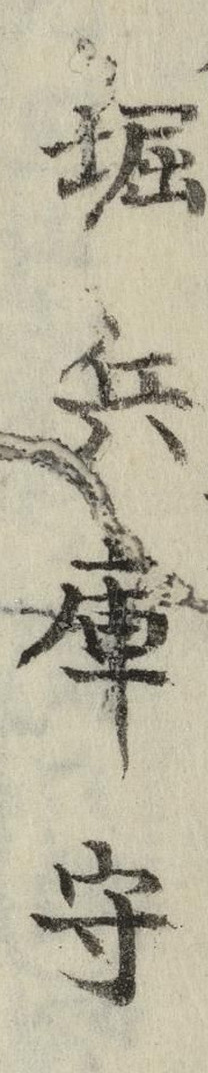堀兵庫守
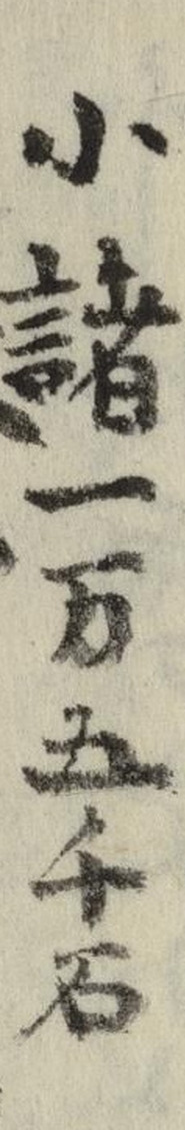小諸一万五千石
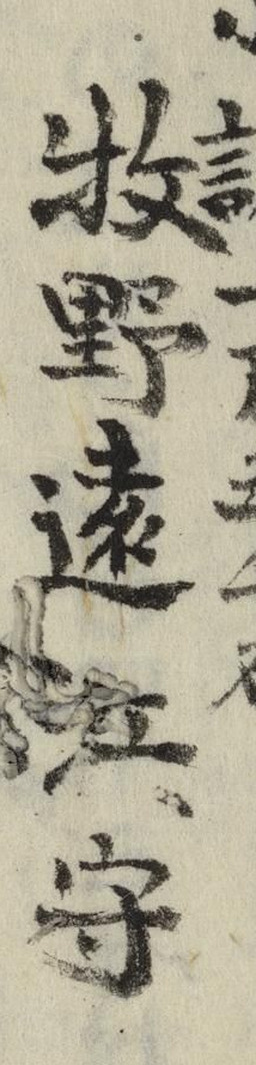牧野遠江守
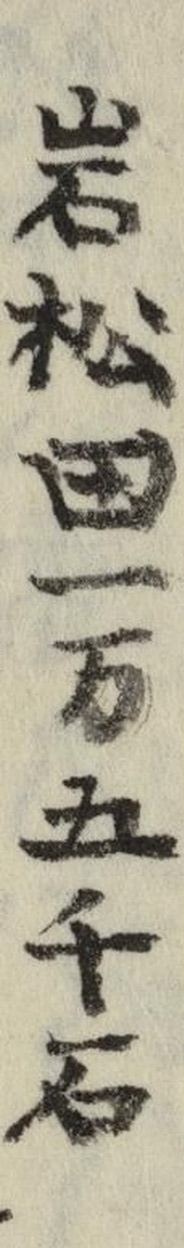岩松田一万五千石
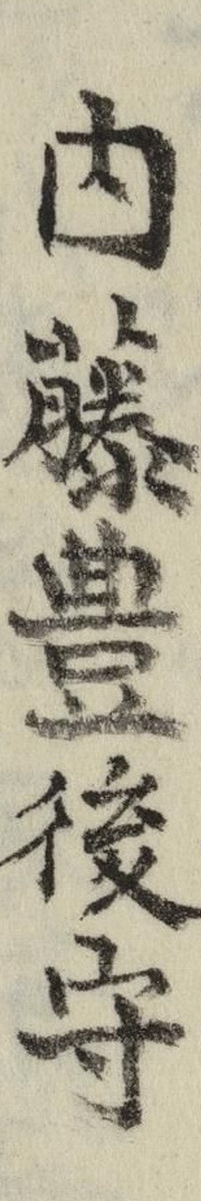内藤豊後守
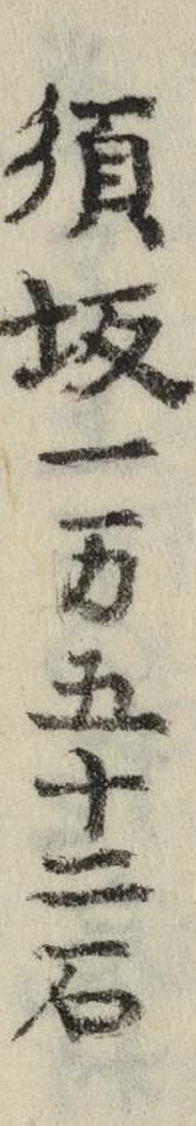須坂一万五十二石
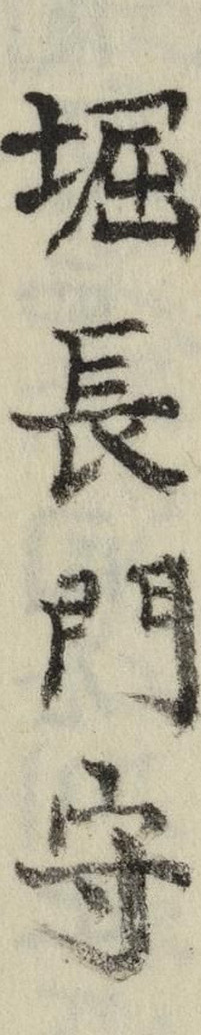堀長門守

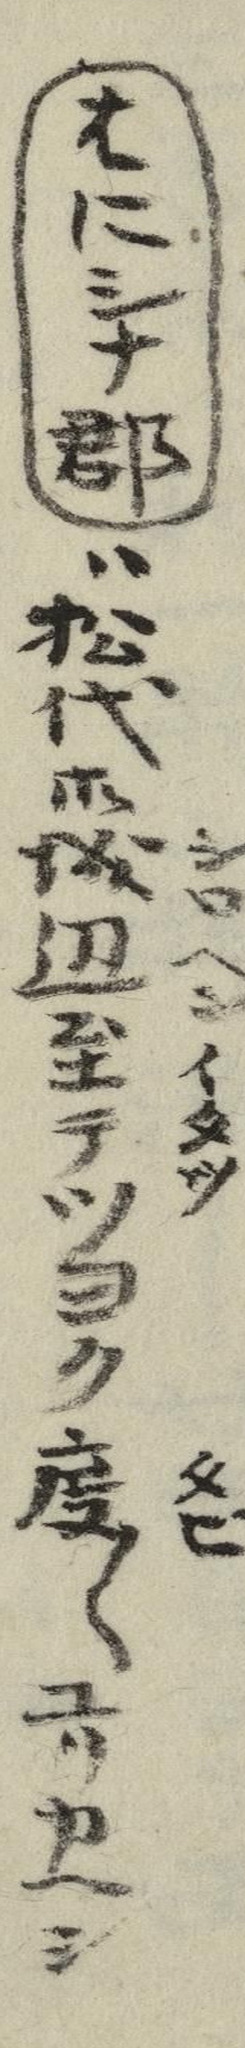はにシナ郡ハ松代御城辺至テツヨク度〳〵ユリカへㇱ
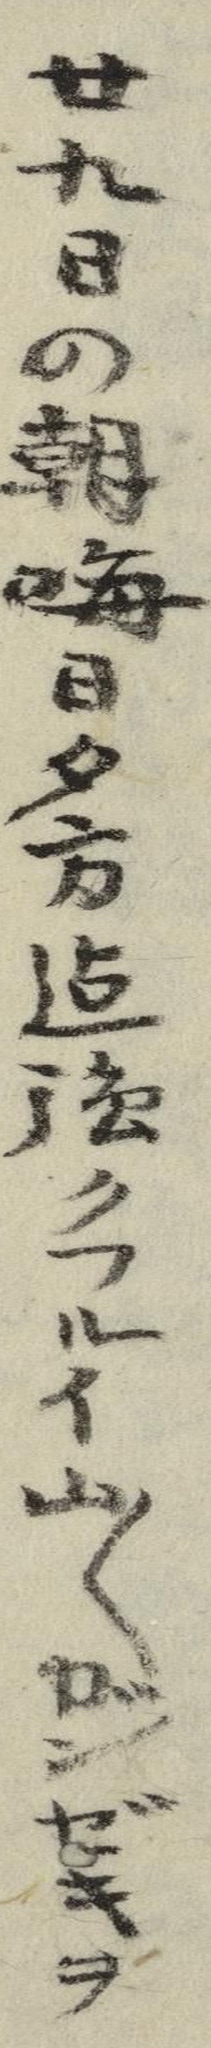廿九日の朝晦日夕方迄強クフルイ山〳〵ガンゼキヲ
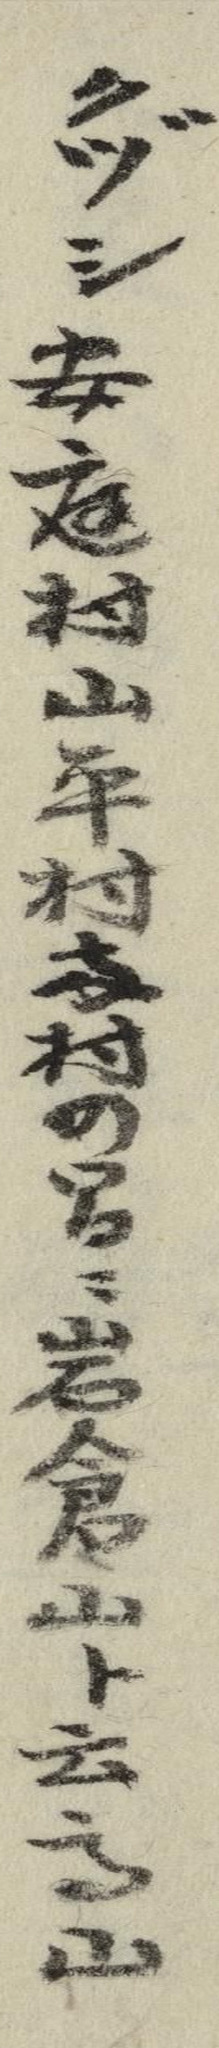クヅシ安庭村山平村両村の間二岩倉山ト云高山
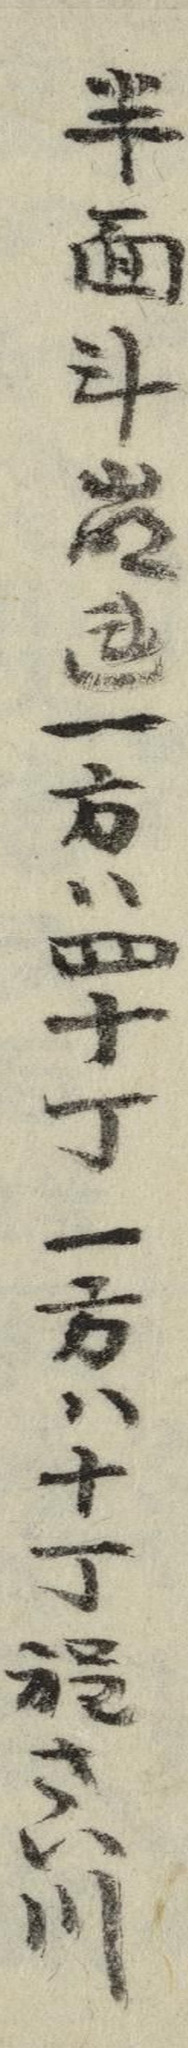半面計崩れ一方ハ四十丁一方ハ十丁程さい川
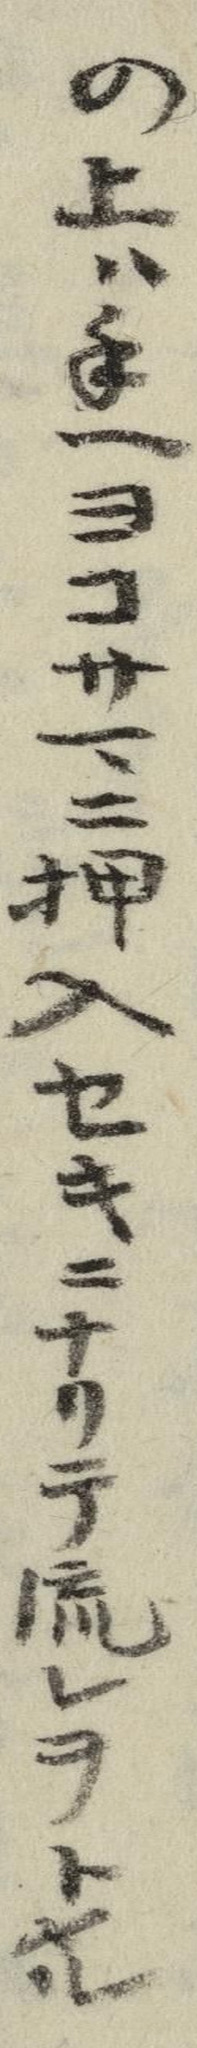の上ハ手へヨコサマ二押入セキ二ナリテ流レヲトメル
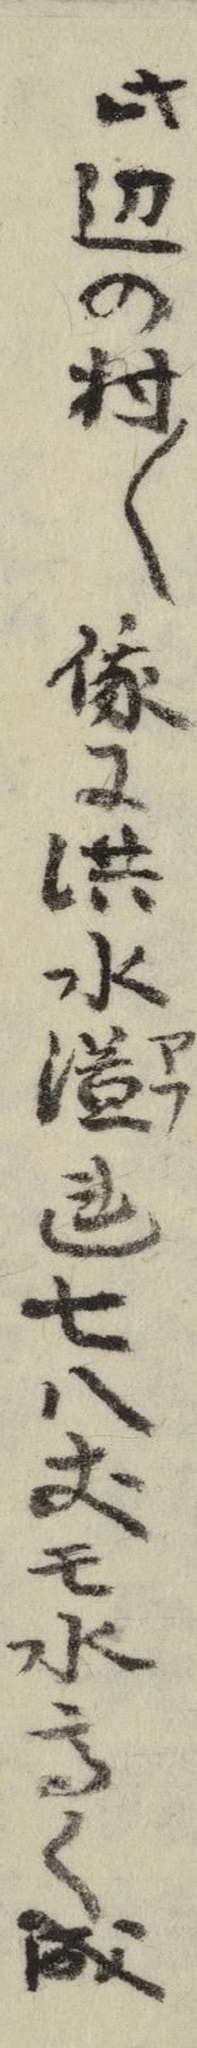此辺の村〳〵俄に洪水溢れ七八丈モ水高く成
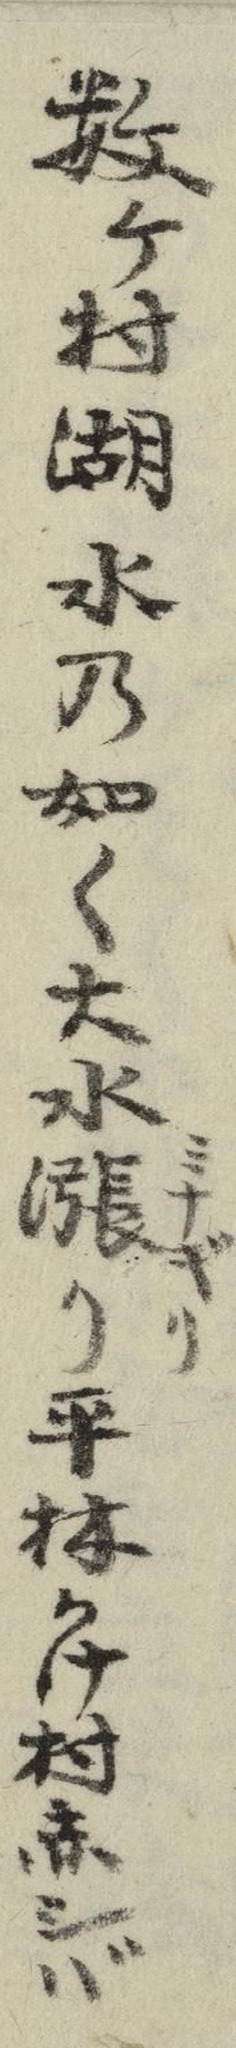数ヶ村湖水の如く大水漲り平林かけ村シバ
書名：信州大地震一件之冩　丁未弘化四年三月吉日
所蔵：東京大学地震研究所図書室 Earthquake Research Institute Library, The University of Tokyo, JAPAN
